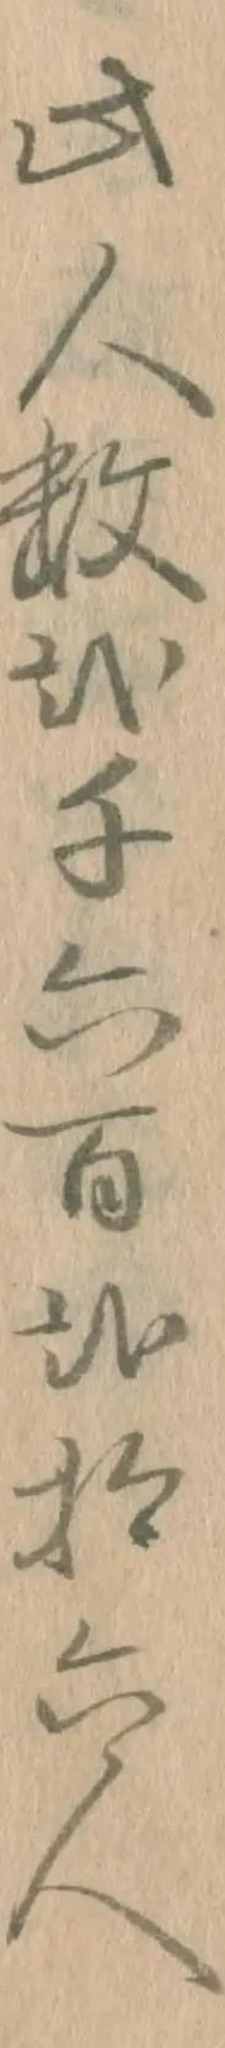此の人数弐千六百弐拾六人
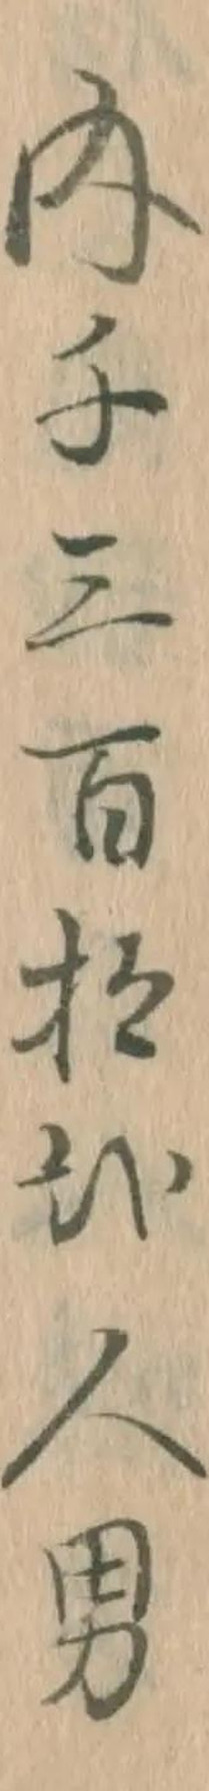内千三百拾弐人男
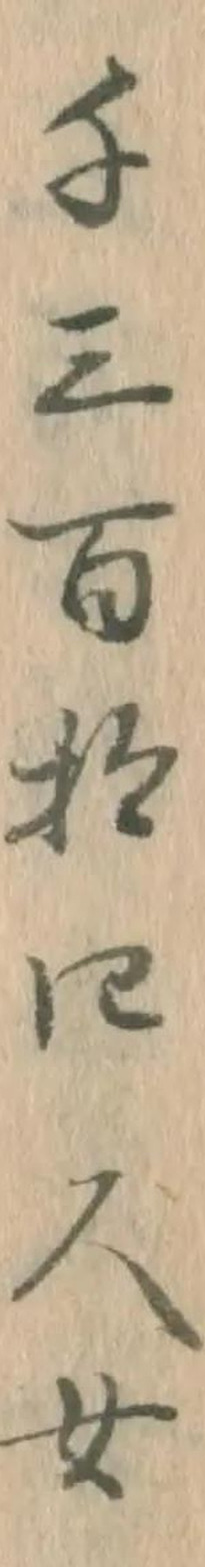千三百拾四人女
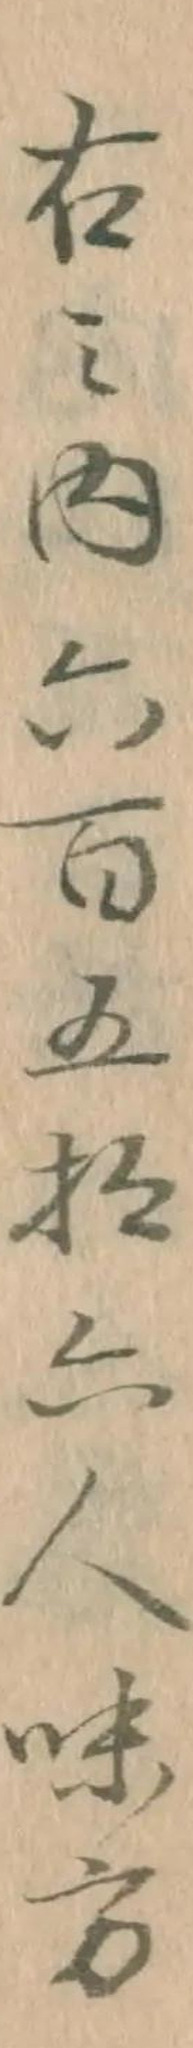右之内六百五拾六人味方
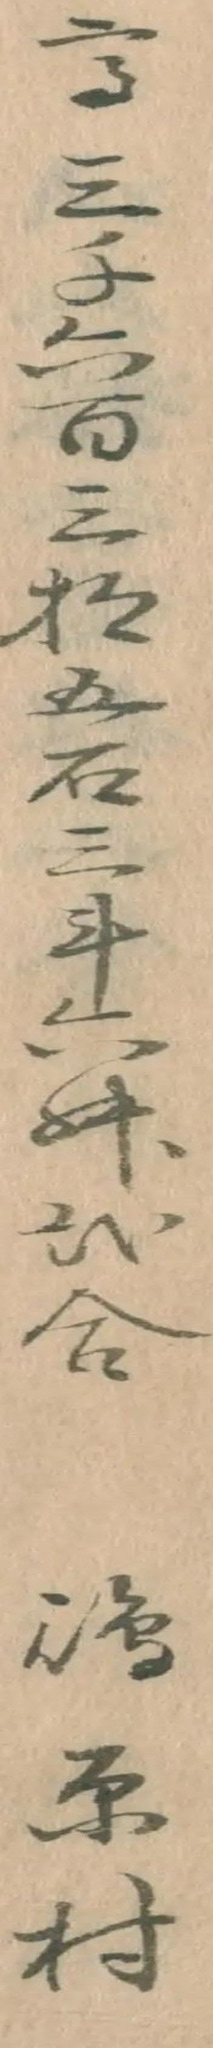高三千六百三拾五石三斗六升弐合島原村

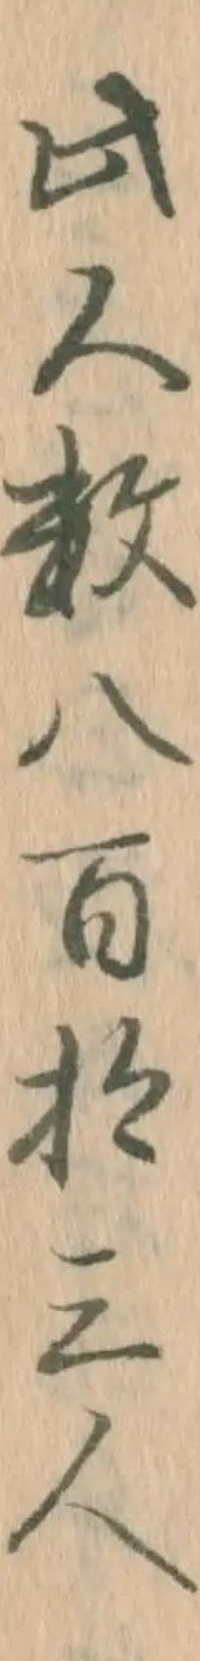此人数八百拾三人
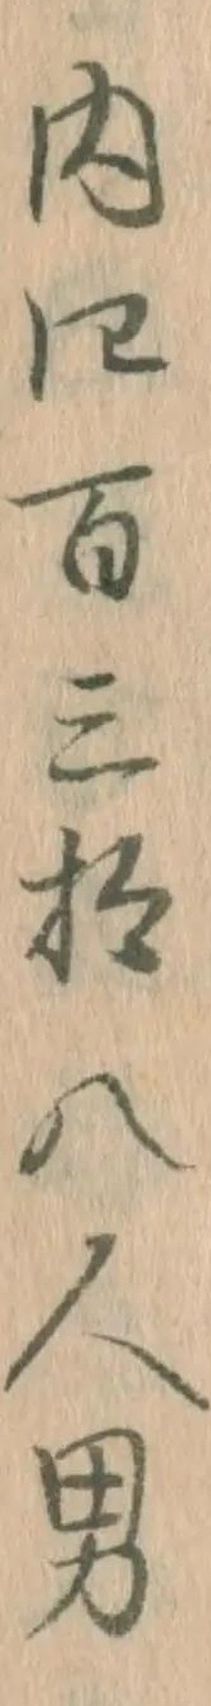内四百三拾八人男
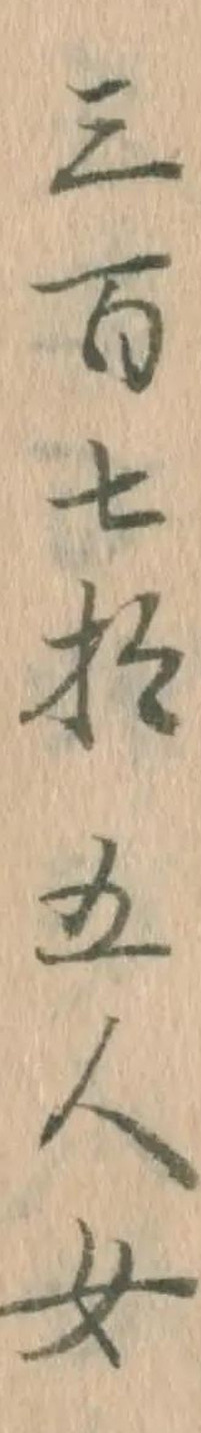三百七拾五人女
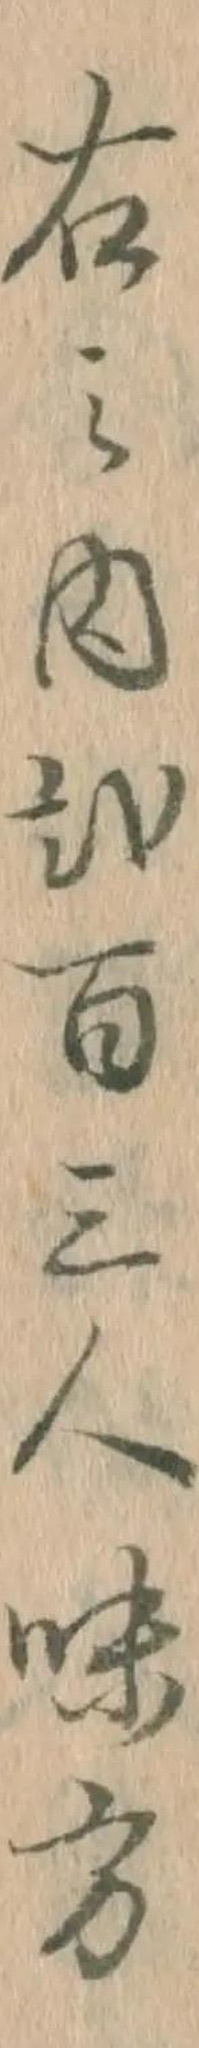右之内弐百三人味方
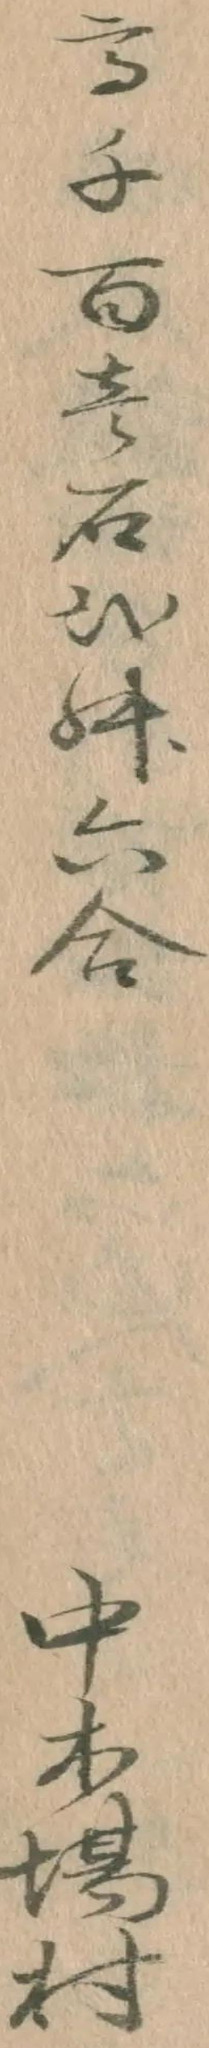高千百壱石弐升六合中木場村
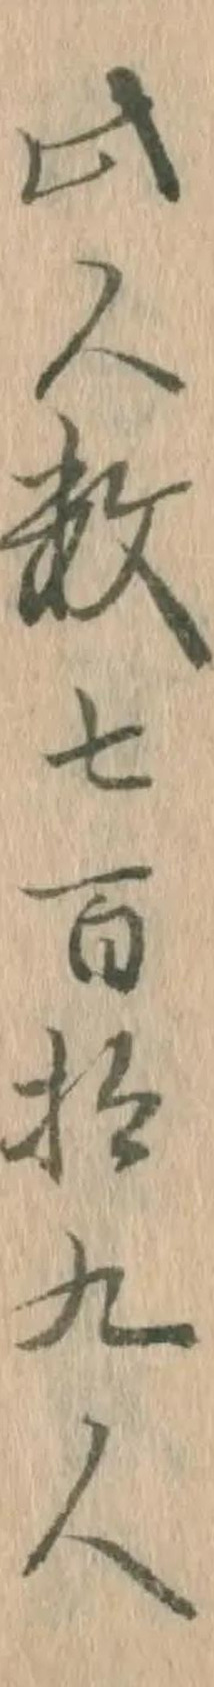此人数七百拾九人
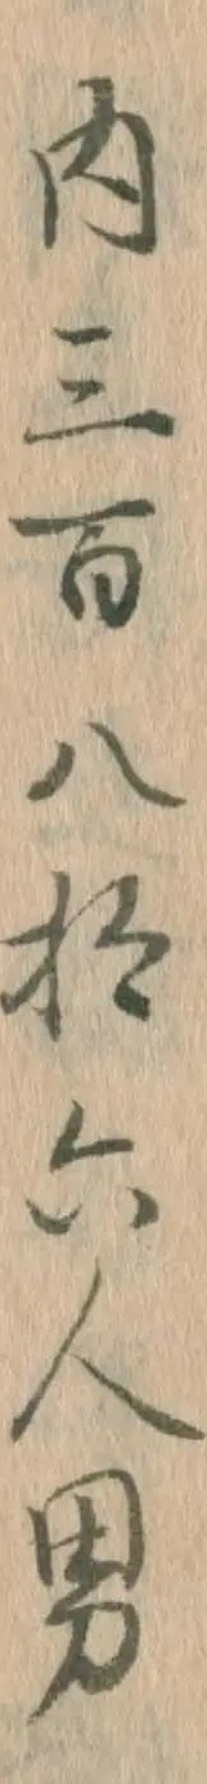内三百八拾六人男
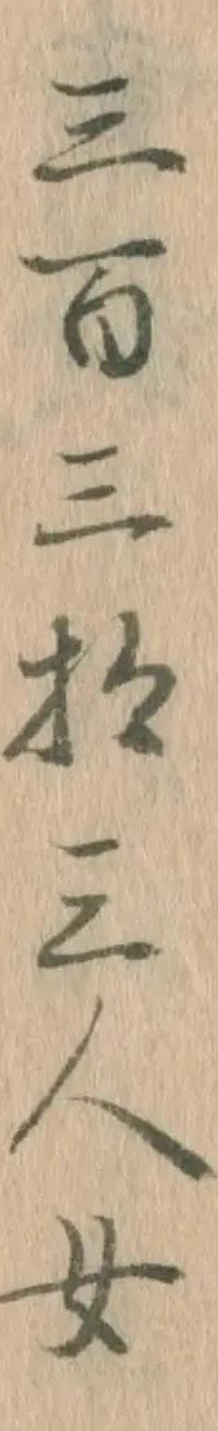三百三拾三人女
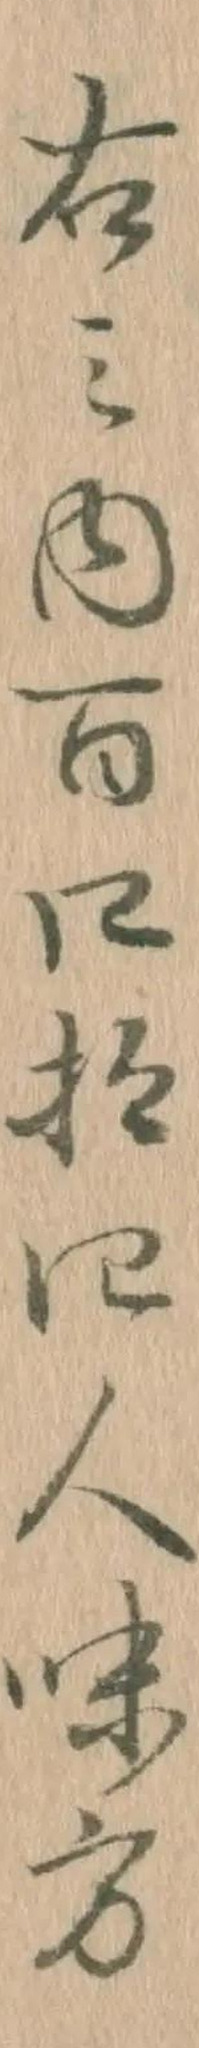右之内百四拾四人味方
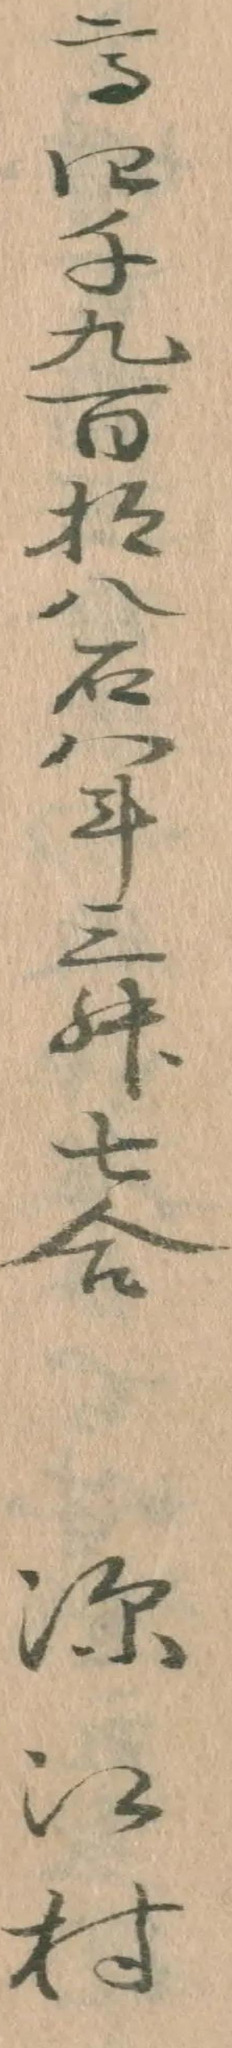高四千九百拾八石八斗三升七合深江村
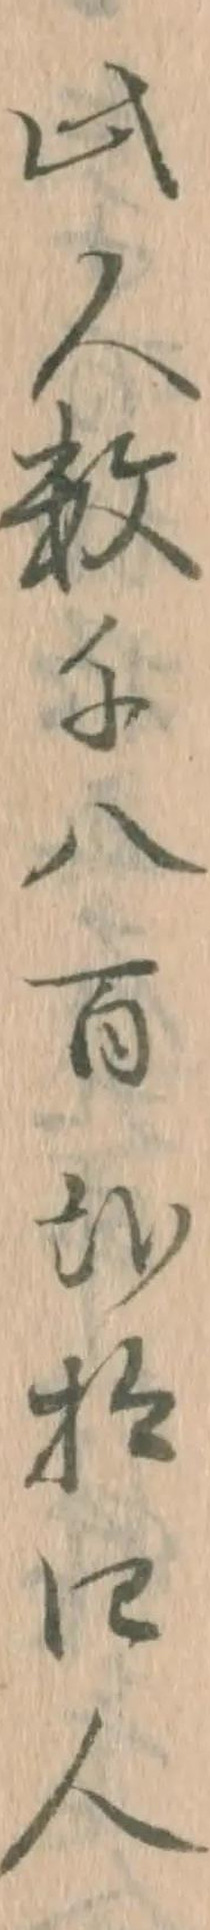此人数千八百弐拾四人
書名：切支丹御退治記 49巻. [2]
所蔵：国立国会図書館 National Diet Library, JAPAN
